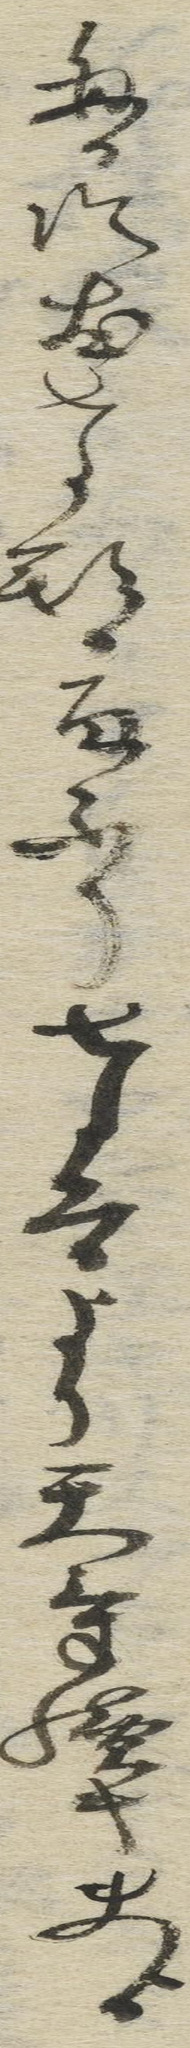毎日冷敷七月朔日雨ふり七月二日より天気続キ夫ゟ
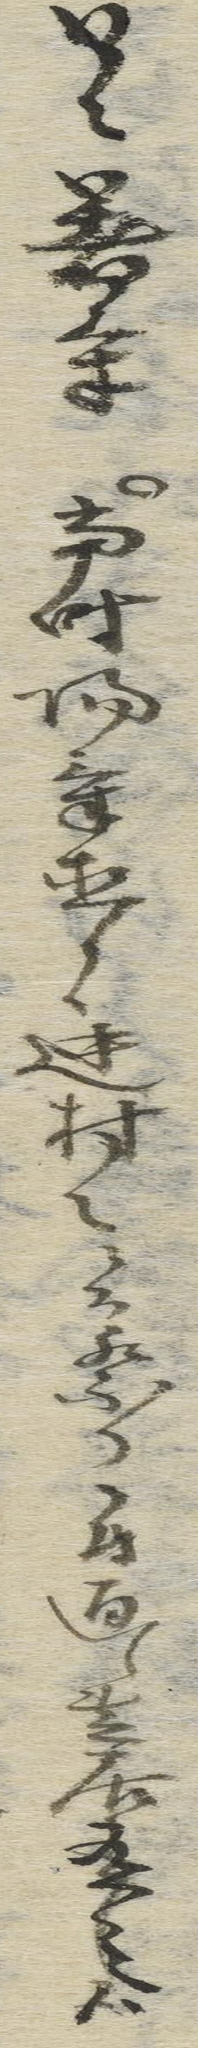日々暑気。当時陽気直々迚村々二而祭二付通し生居有之候
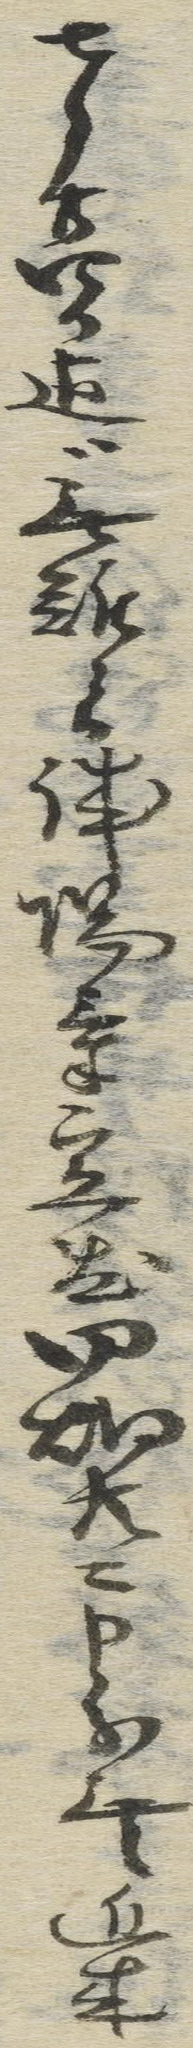七月廿四日迄ハ無難二而誠陽気宜敷田畑共二申分無之近年
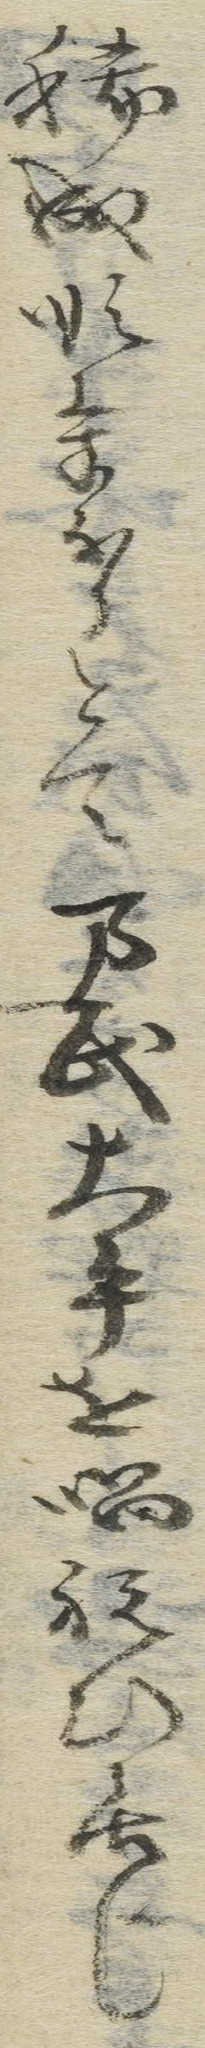稀成順気なりとて万民大午を唱祝ひ居申候
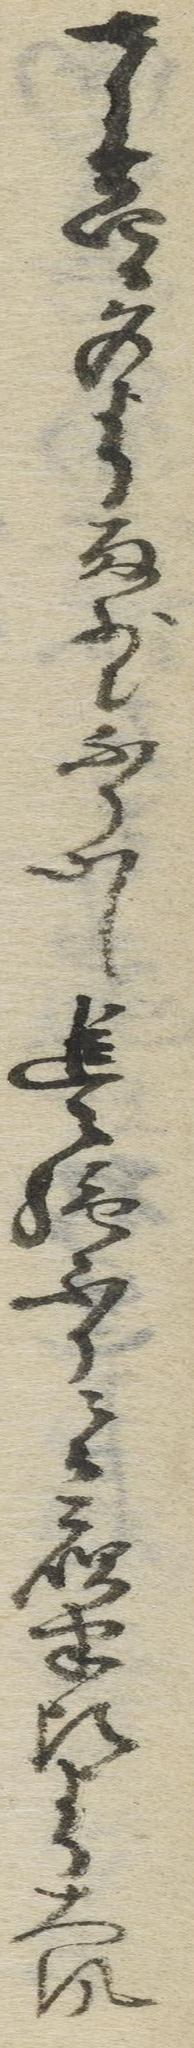七月廿四日夕より雨少し降り出し追々強ふり二而夜半頃より大風
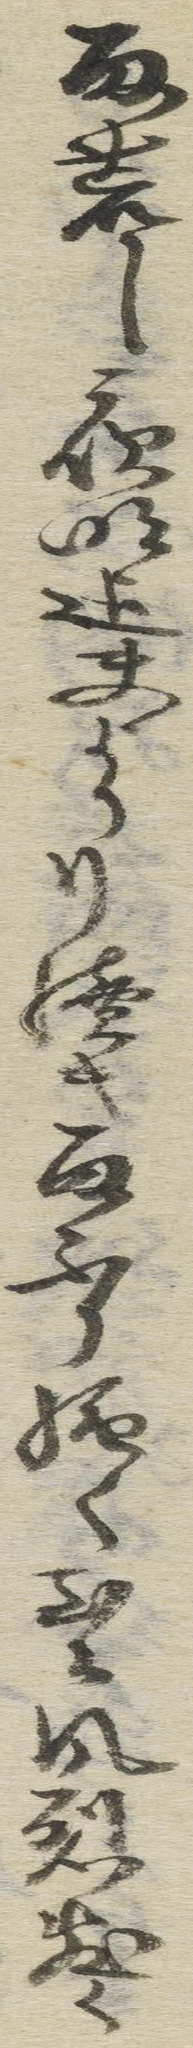雨嵐し夜明迄夫より引続キ雨ふり強く至而風烈敷く
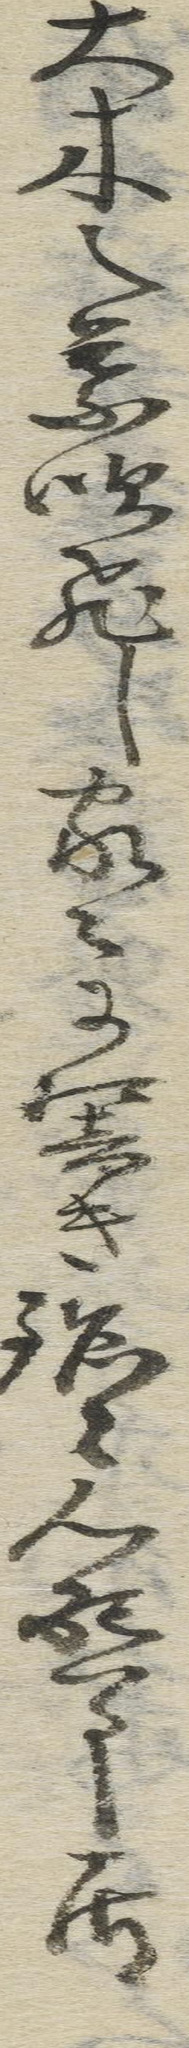大木之葉吹飛し家々二響き銘々心配いたし居
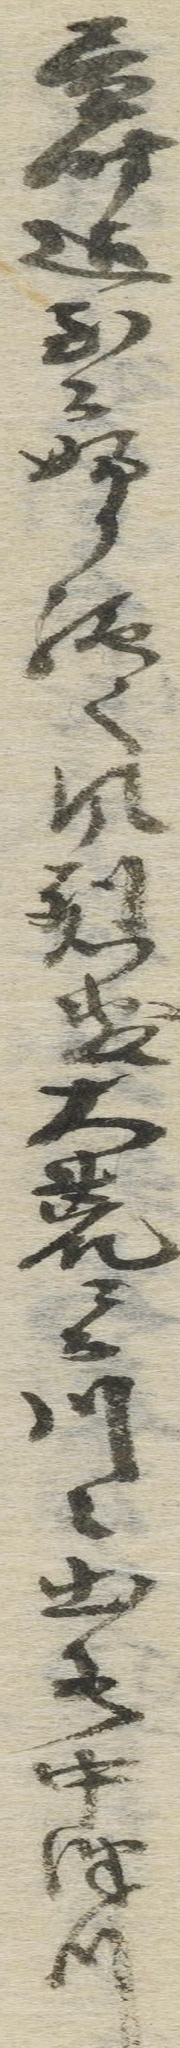昼時迄至而ふり強く風烈敷大荒二而川々出水中津川
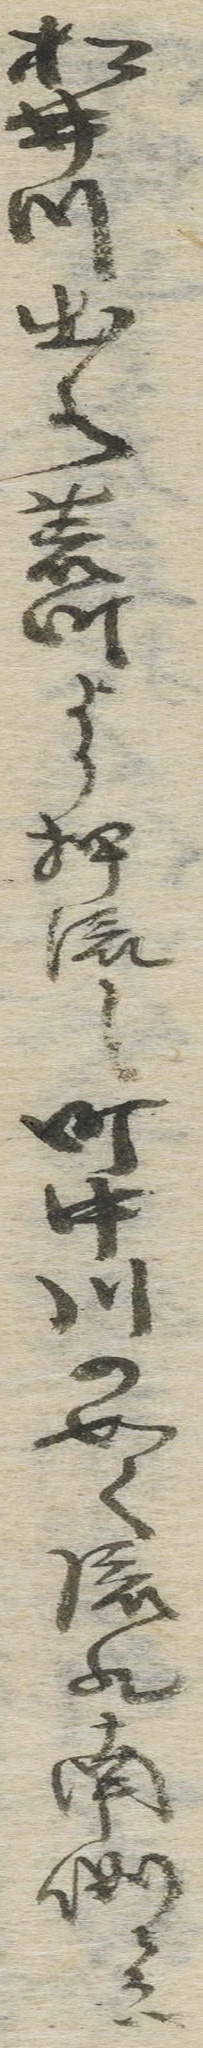松井川出水荒町より押流し町中川之如く流れ南側二而ハ
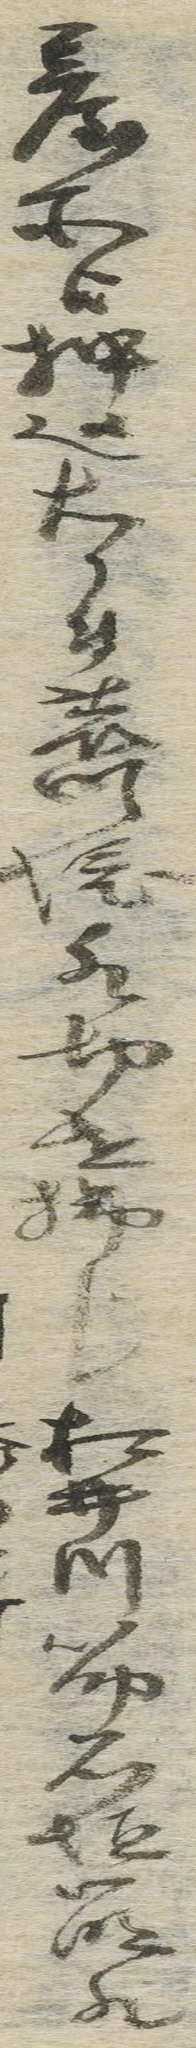居所江押込右二付荒町境水切を払申候松井川筋石垣崩れ
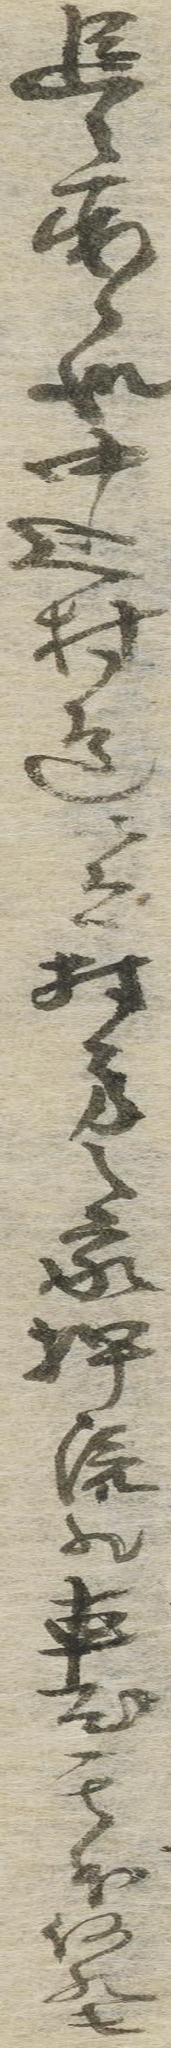追々承候処中込村辺二而ハ村方之家押流れ車屋其外何れも
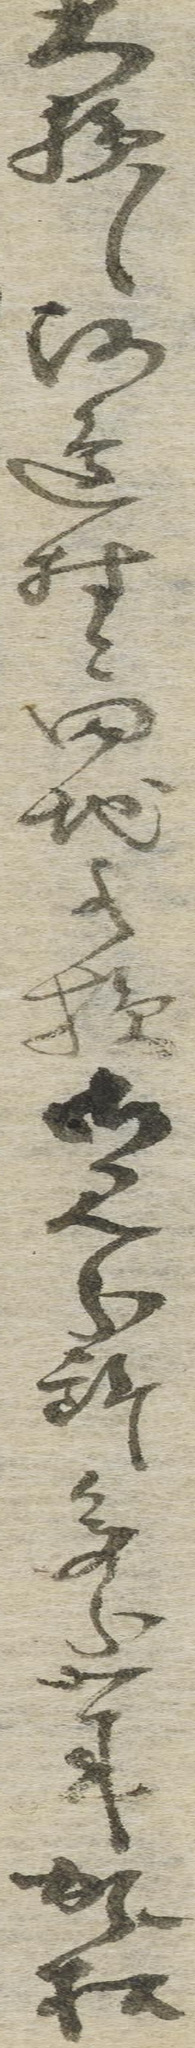大損し河辺村々田地に損御見分所多分出来から松
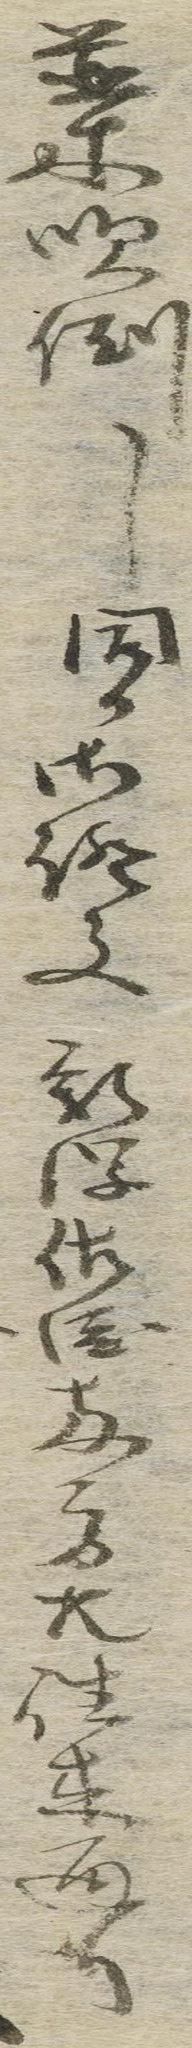並木吹倒し同日御證文新潟佐渡両方共往来通行
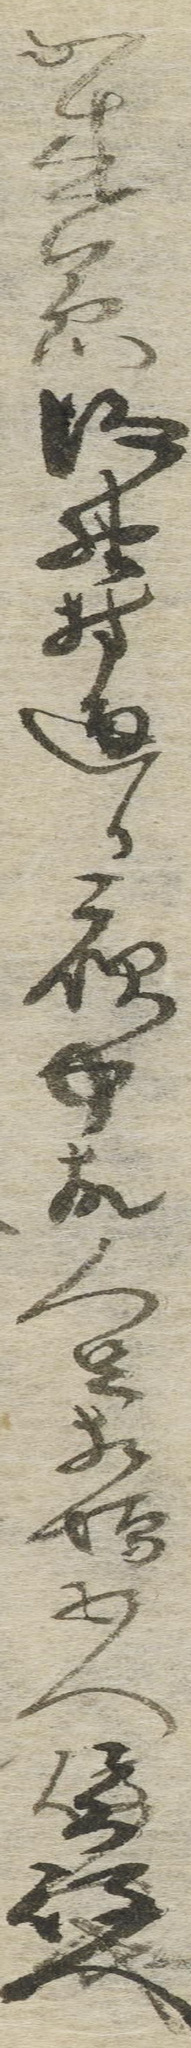出来兼塩野村通り夜半故人足相増五人二而役人
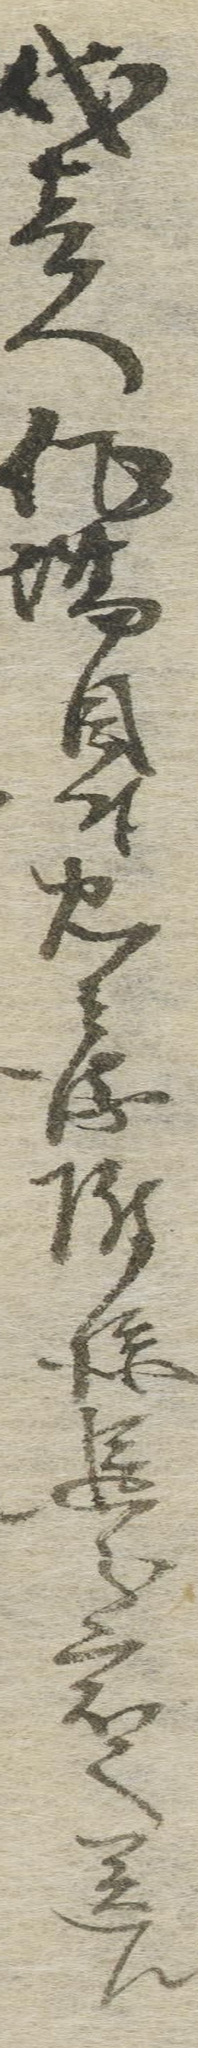代壱人作場目付忠兵衛添追分宿へ送候
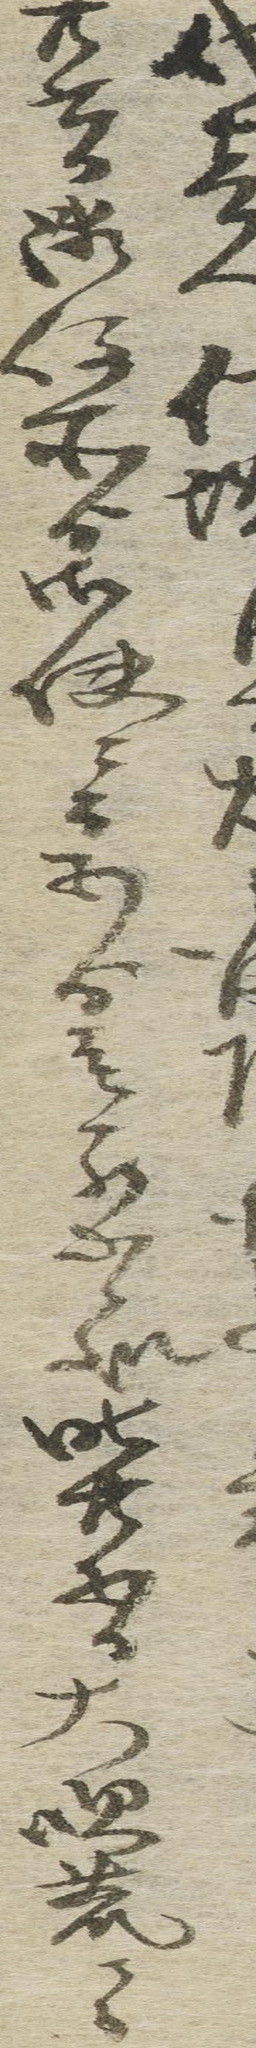廿六日御役所ゟ御使二而五右衛門義罷出候様昨廿五日大吹荒二而
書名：信濃越後　地震書留
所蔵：東京大学地震研究所図書室 Earthquake Research Institute Library, The University of Tokyo, JAPAN
